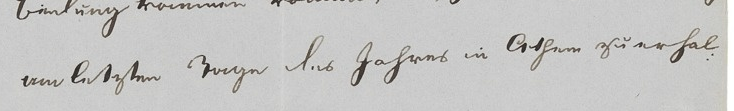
am letzten Tage des Jahres in Athem zu erhal-
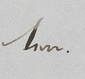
ten.
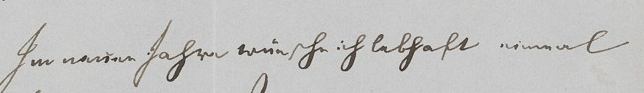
Im neuen Jahre wünsche ich lebhaft einmal
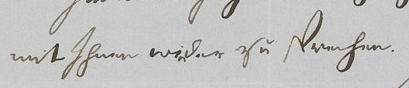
mit Ihnen wieder zu sprechen.
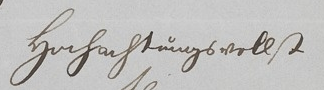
hochachtungsvollst
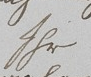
Ihr
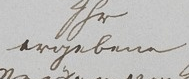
ergebene
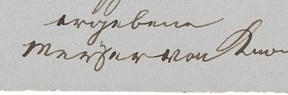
Meyer von Knonau
